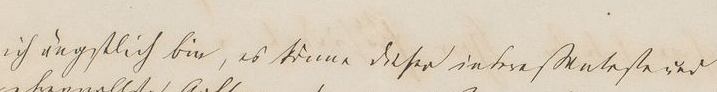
ich ängstlich bin, es könne dieser intereßanteste und
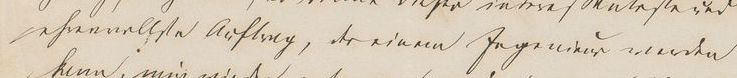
ehrenvollste Auftrag, der einem Ingeniuer werden
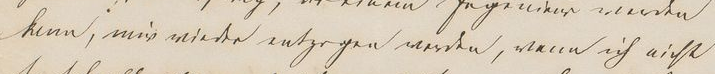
kann, mir wieder entzogen werden, wenn ich nicht
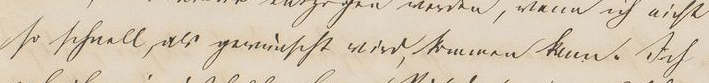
so schnell, als gewünscht wird, kommen kann. Ich
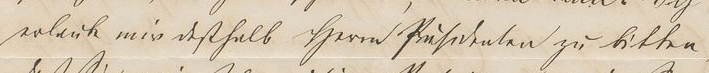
erlaube mir deßhalb Herrn Präsidenten zu bitten,
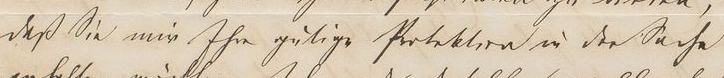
daß sie mir Ihre gütige Protektion in der Sache
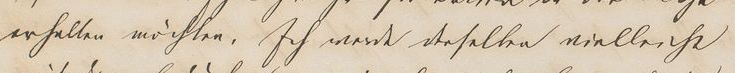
erhalten möchten. Ich werde derselben vielleicht
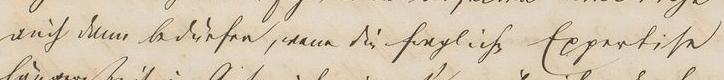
auch dann bedürfen, wenn die fragliche Expertise
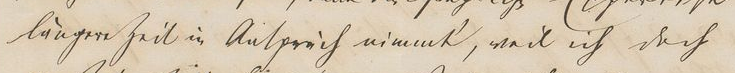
längere Zeit in Anspruch nimmt, weil ich doch
